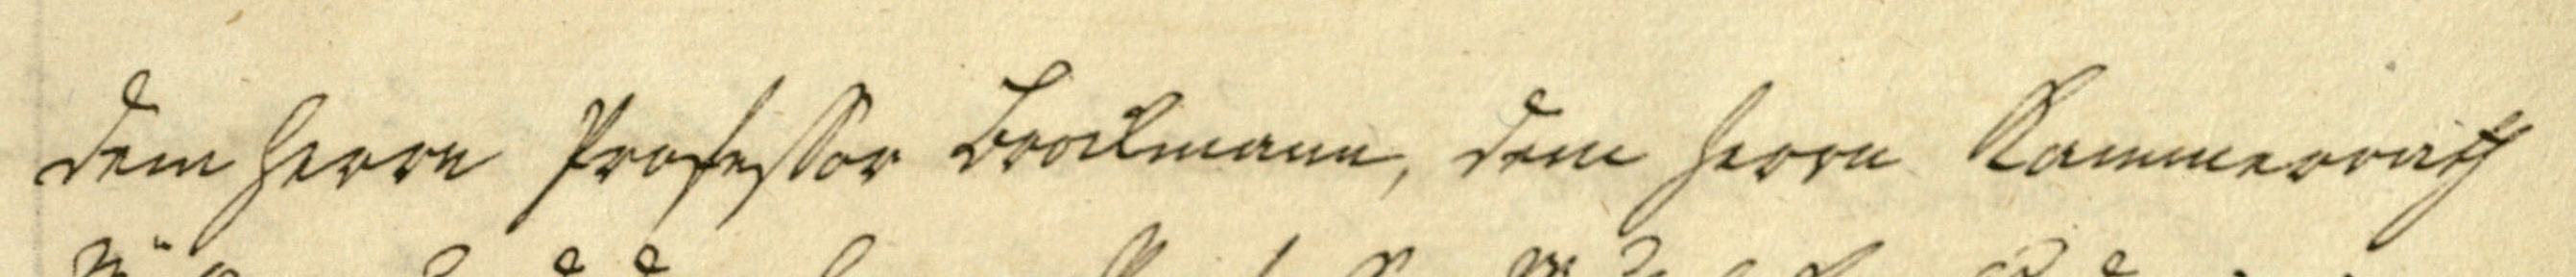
dem Herrn Professor Brockmann, dem Herrn Kammerrath
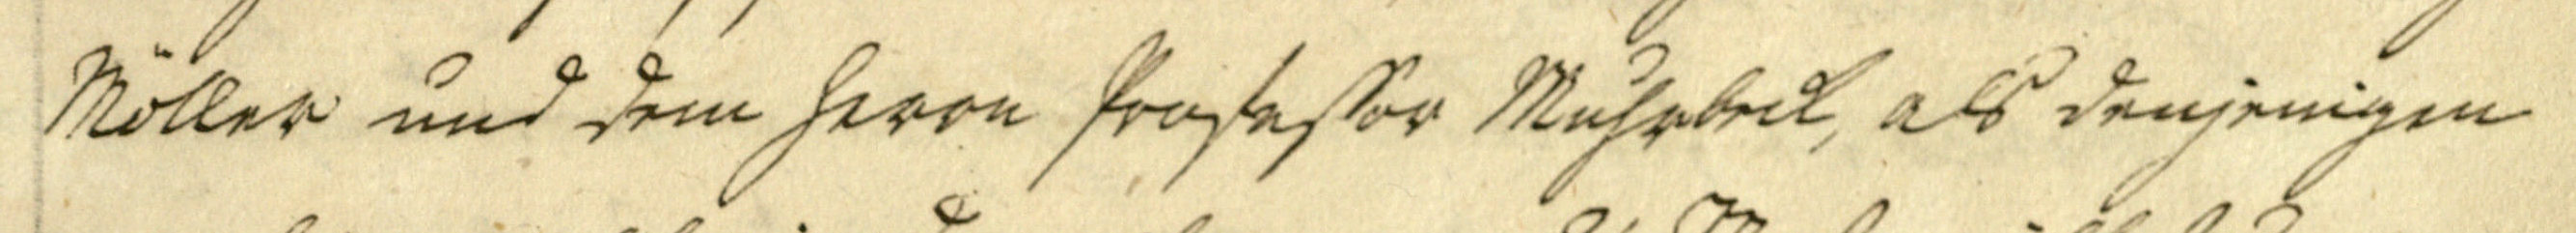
Möller und dem Herrn Professor Muhrbeck, als denjenigen
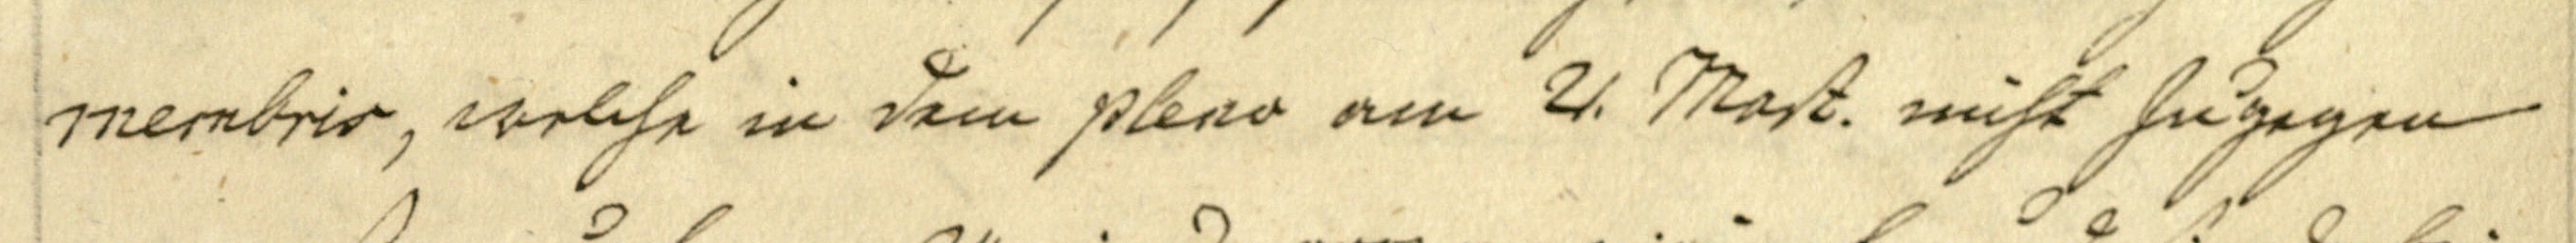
membris, welche in dem pleno am 24. Mart. nicht zugegen
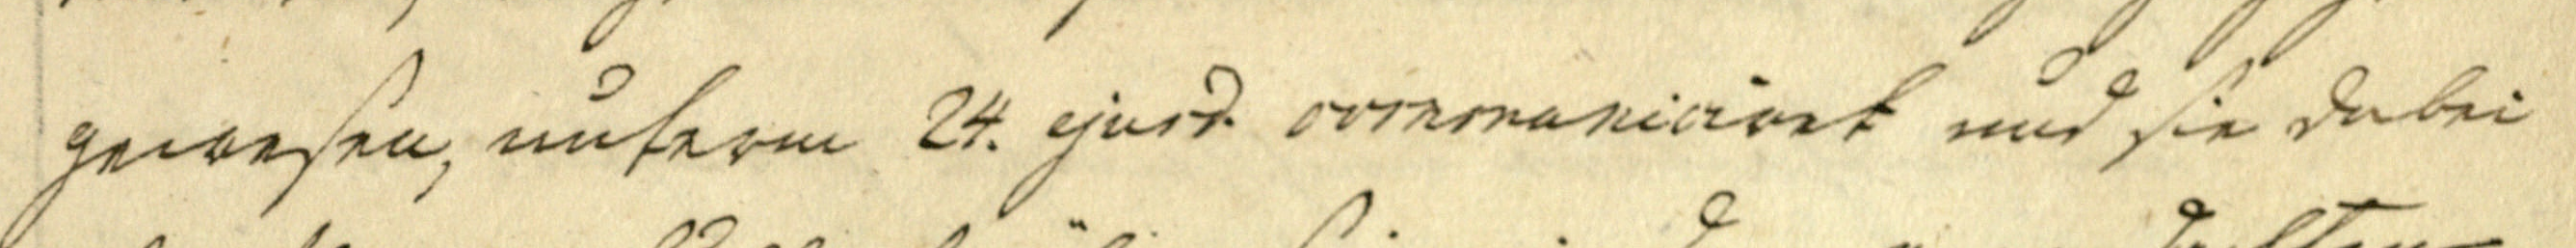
gewesen, unterm 24. ejusd. communiciret und sie dabei
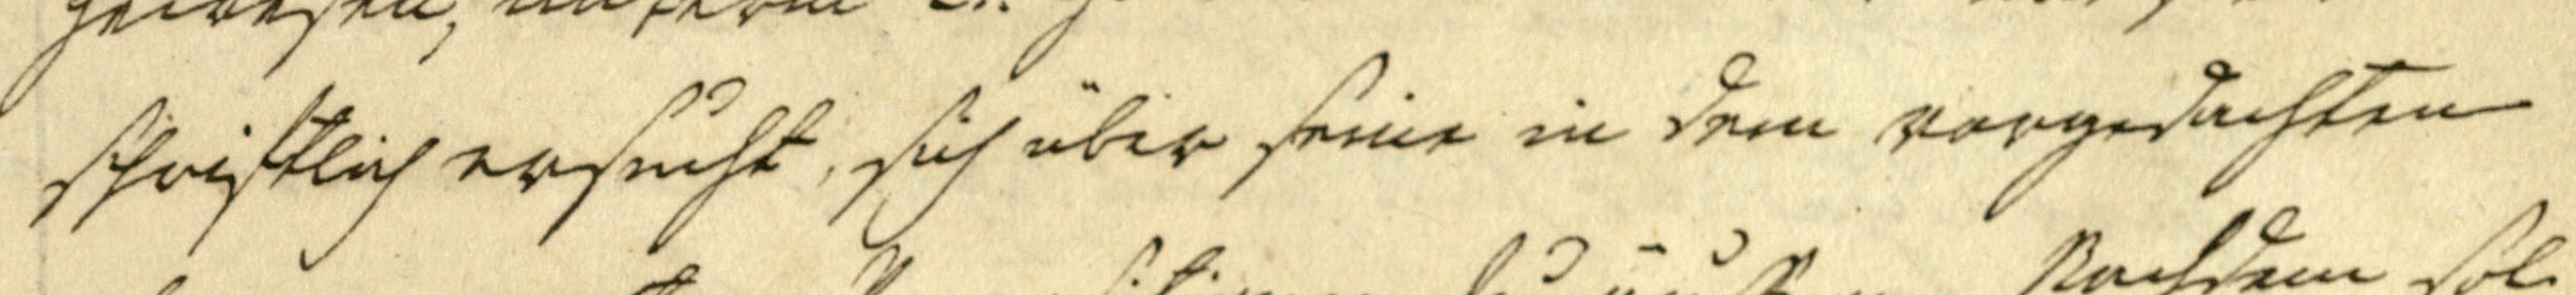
schriftlich ersucht, sich über seine in dem vorgedachten
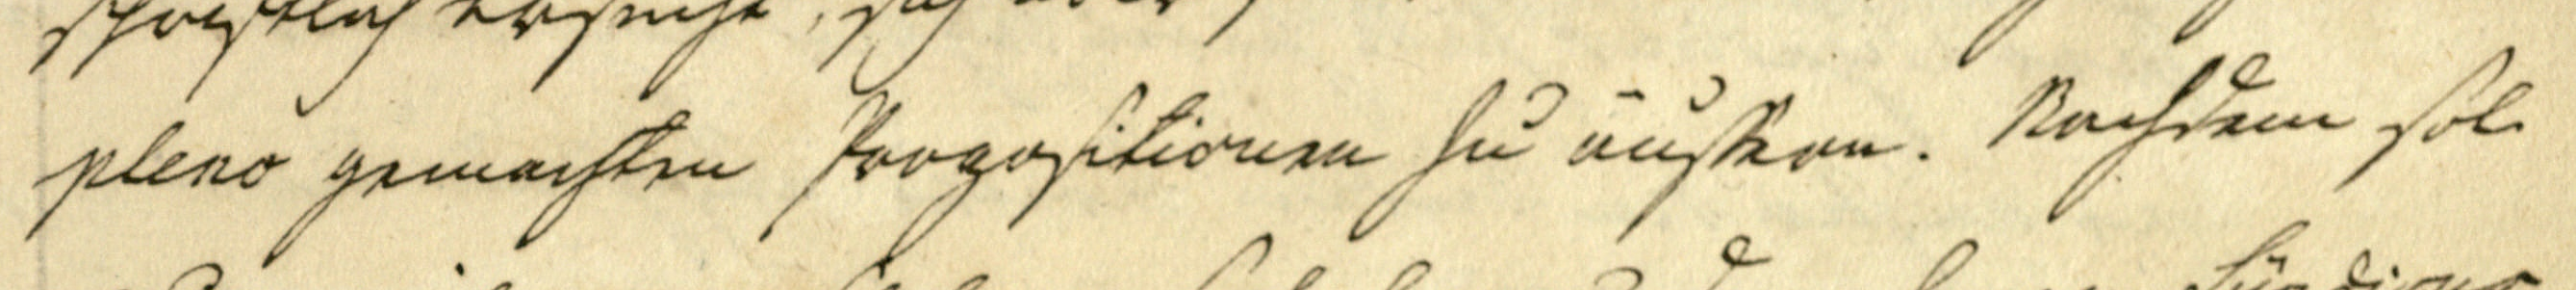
pleno gemachten Propositionen zu äussern. Nachdem sol¬
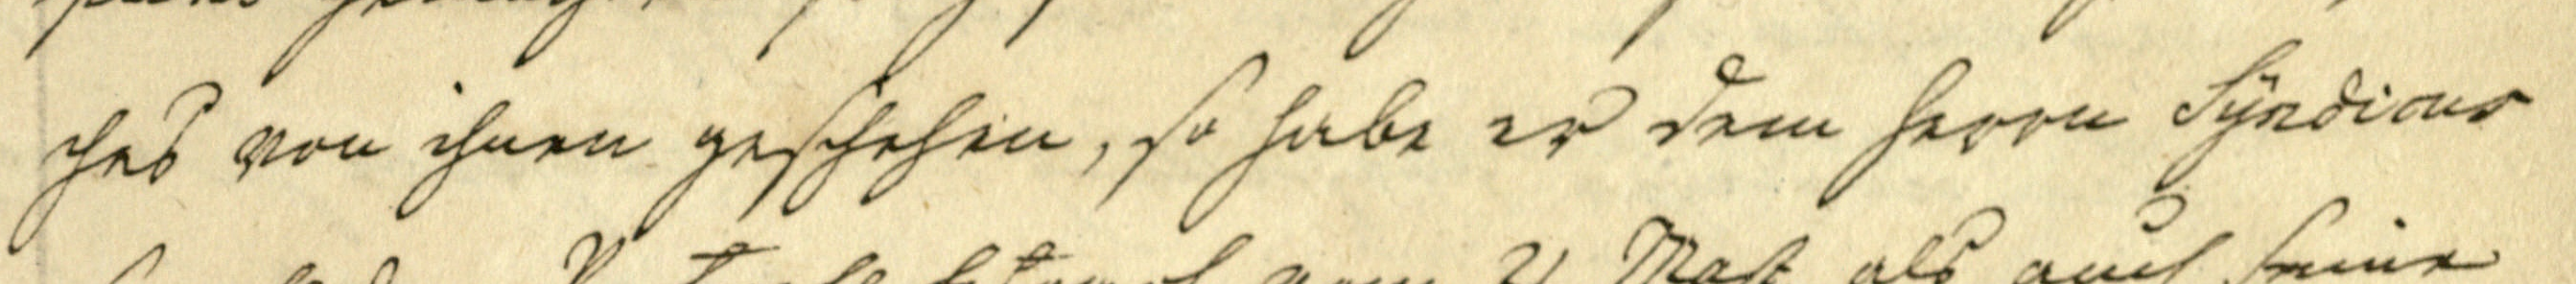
ches von ihnen geschehen, so habe er dem Herrn Sÿndicus
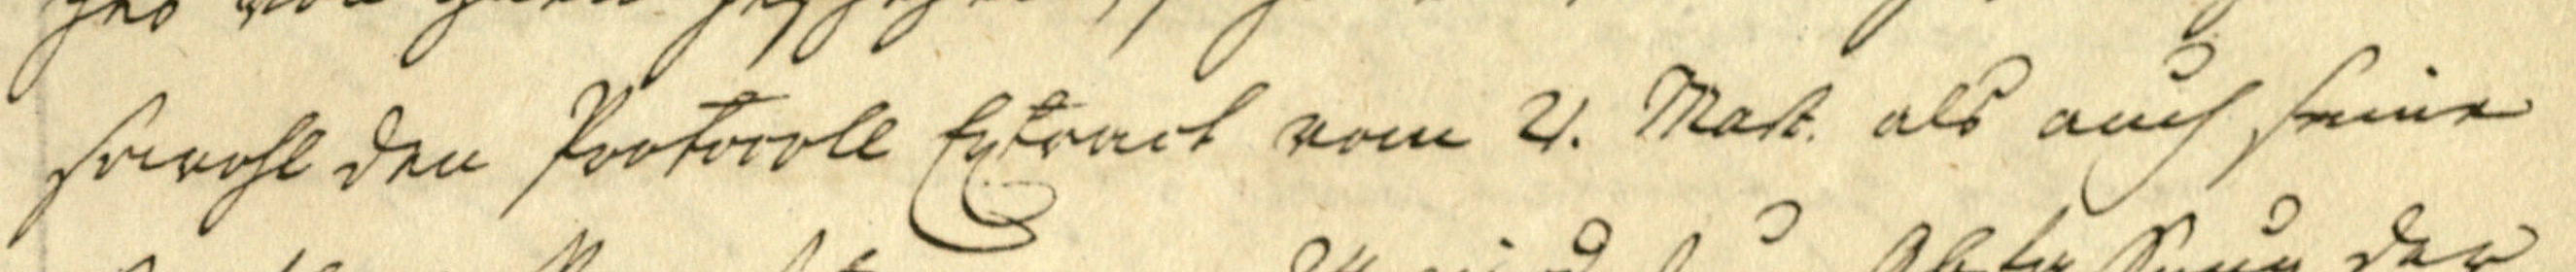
sowohl den Protocoll Extract vom 21. Mart als auch seine
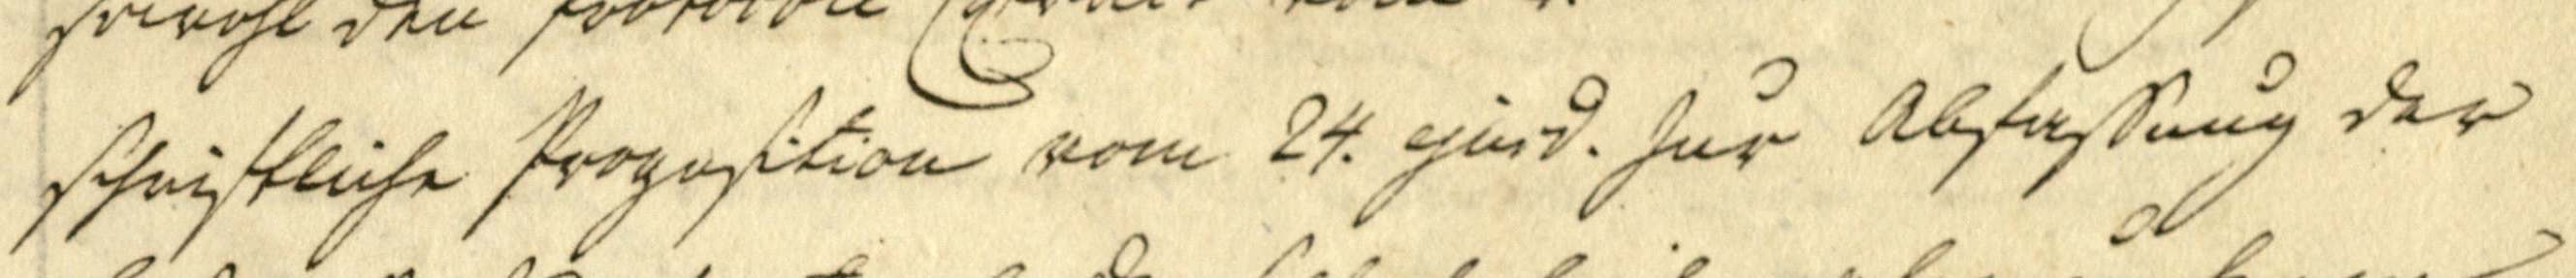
schriftliche Proposition vom 24. ejusd. zur Abfassung der
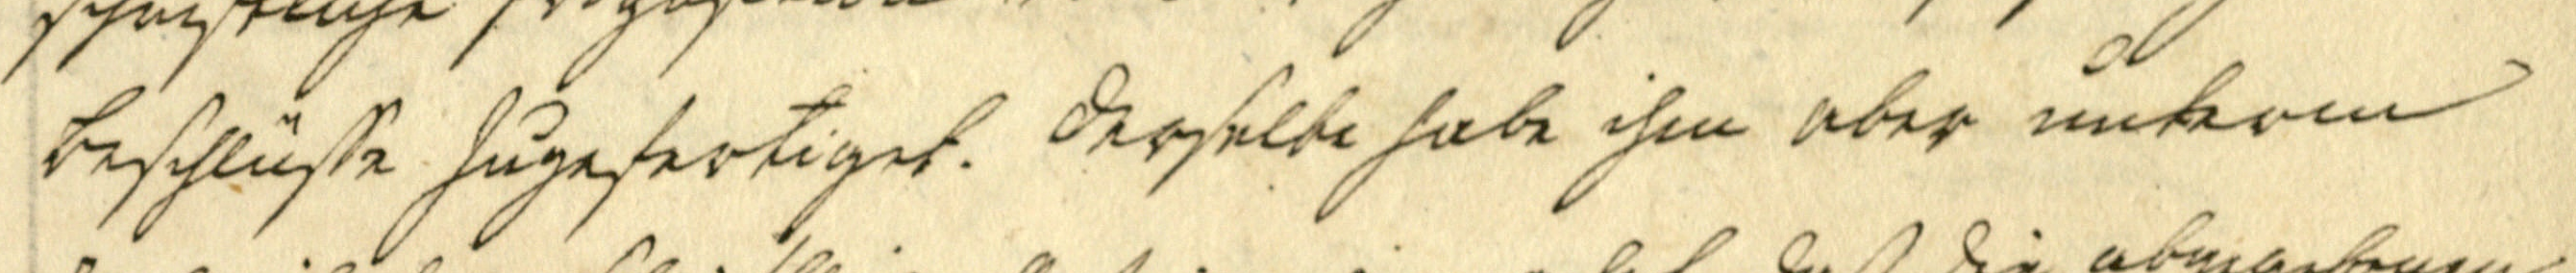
Beschlüsse zugefertiget. Derselbe habe ihm aber unterm
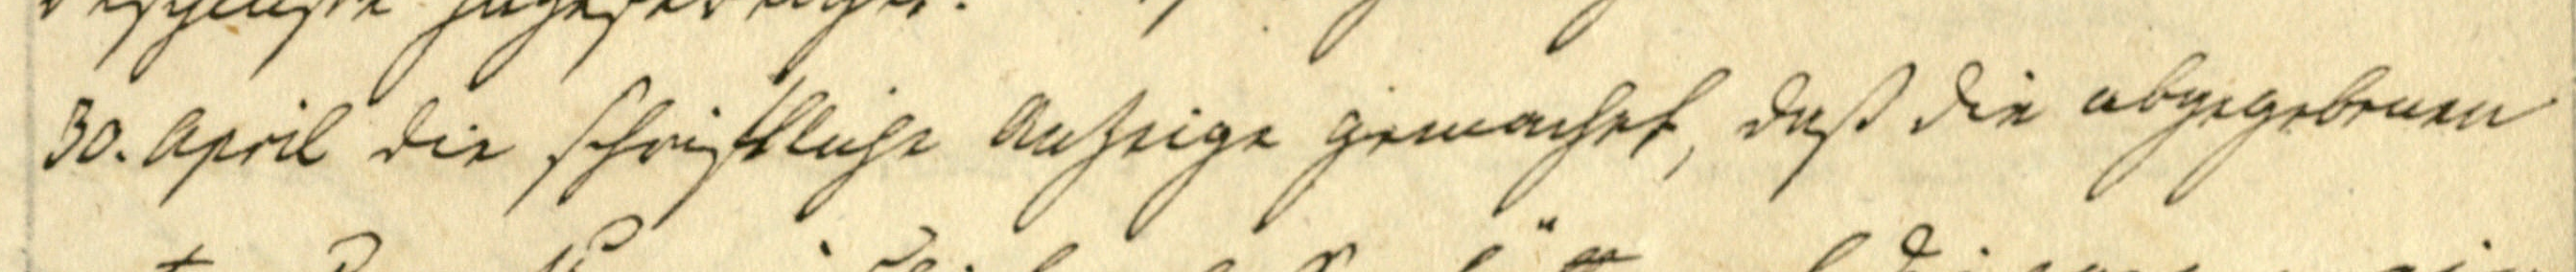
30. April die schriftliche Anzeige gemachet, daß die abgegebenen
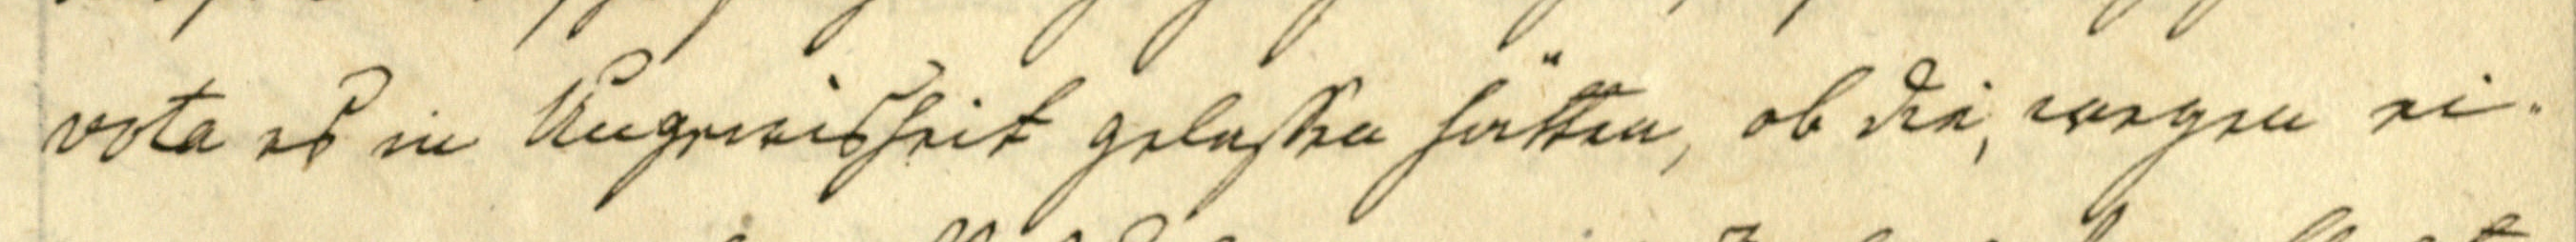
vota es in Ungewisheit gelassen hätten, ob die wegen ei¬
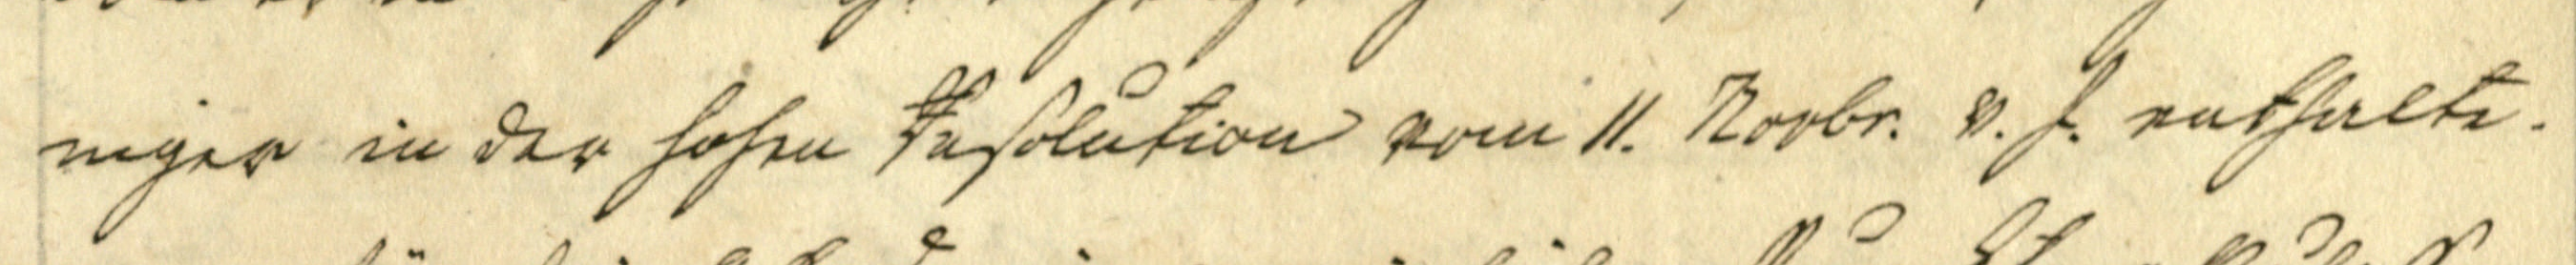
niger in der hohen Resolution vom 11. Novbr. v. J. enthalte¬
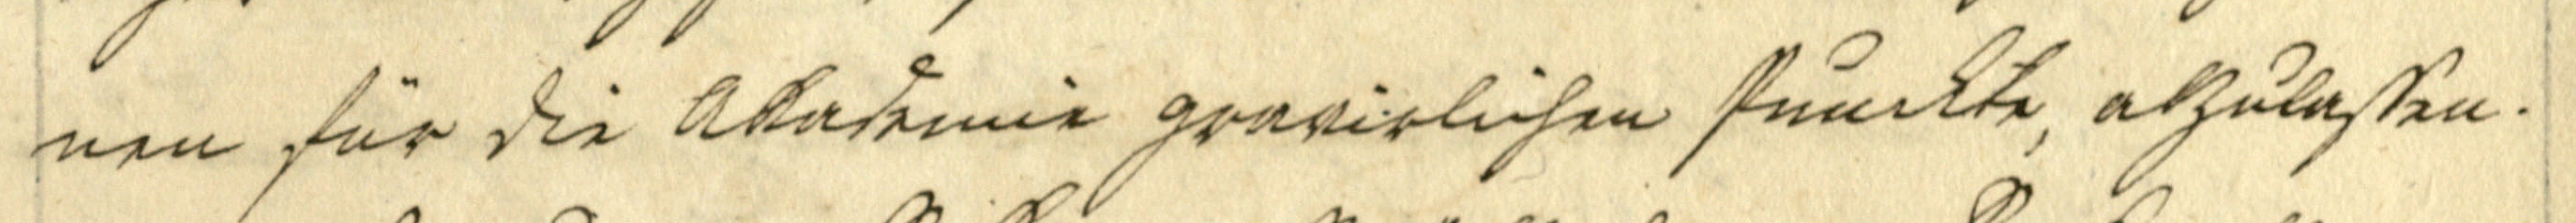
nen für die Akademie gravirlichen Punckte, abzulassen¬
